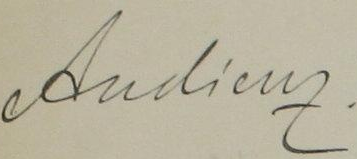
Audienz
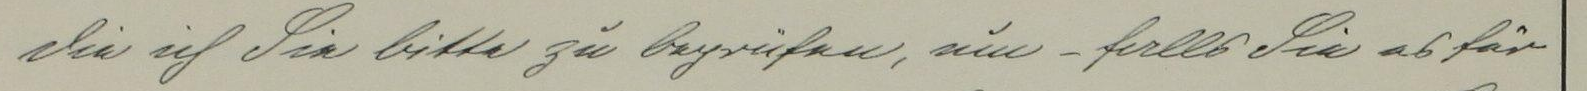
die ich Sie bitte zu beprüfen, um – falls Sie es für
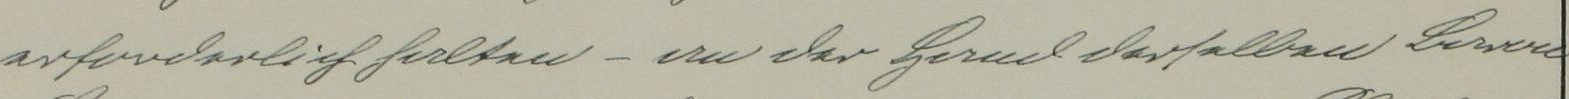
erforderlich halten – an der Hand derselben Baron
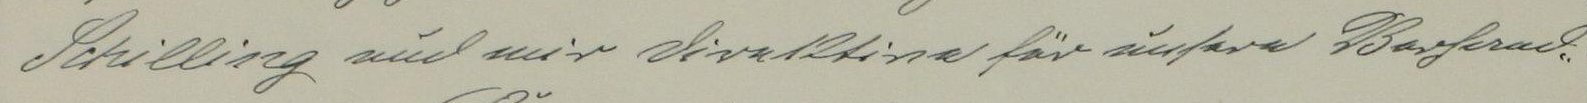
Schilling und mir Direktive für unsere Verhand-
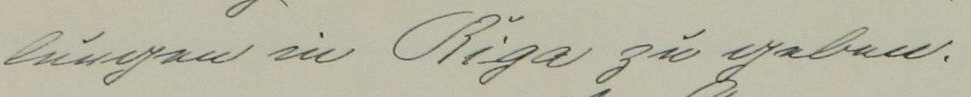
lungen in Riga zu geben.
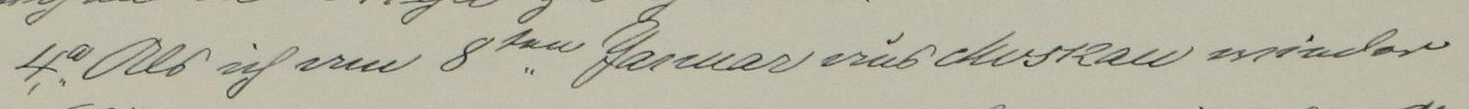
4a. Als ich am 8ten Januar aus Moskau wieder
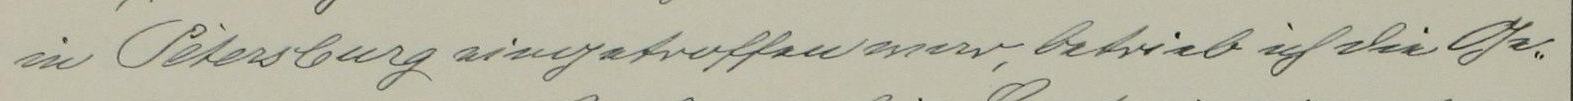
in Petersburg eingetroffen war, betrieb ich die Ge-
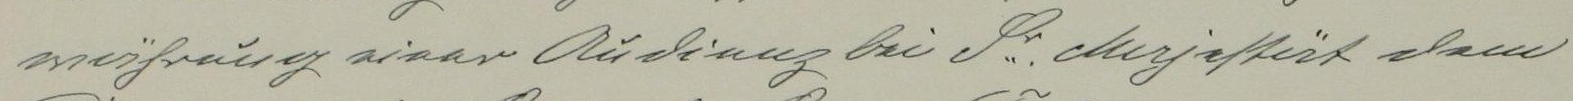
währung einer Audienz bei Sr. Majestät dem
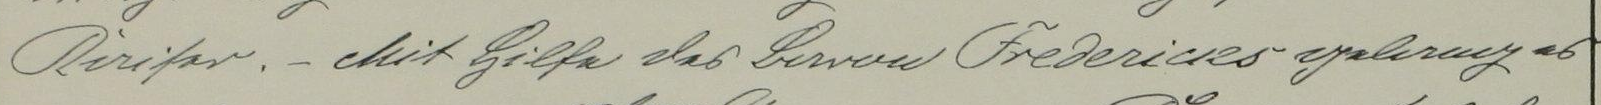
Kaiser. – Mit Hilfe des Baron Fredericks gelang es
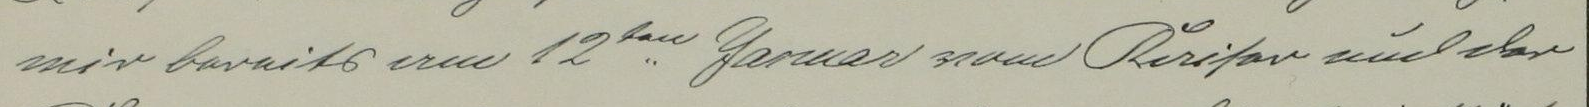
mir, bereits am 12ten Januar vom Kaiser und der
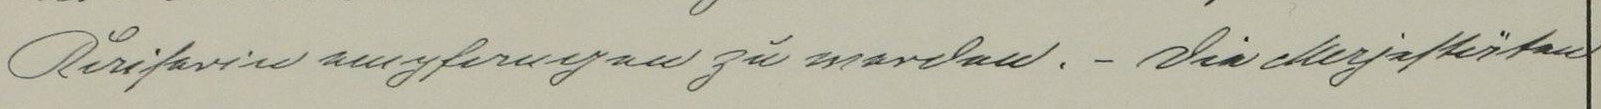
Kaiserin empfangen zu werden. – Die Majestäten
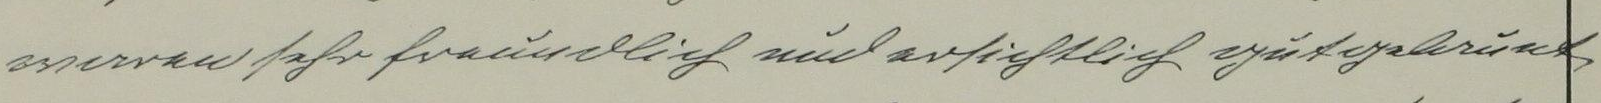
waren sehr freundlich und ersichtlich gutgelaunt,
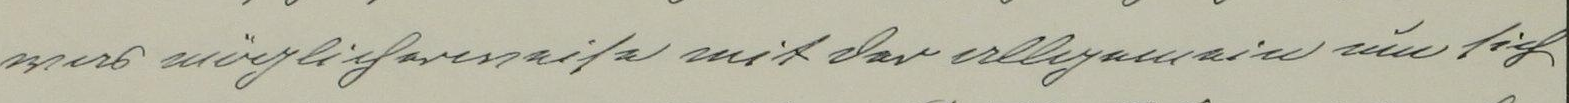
was möglicherweise mit der allgemein um sich
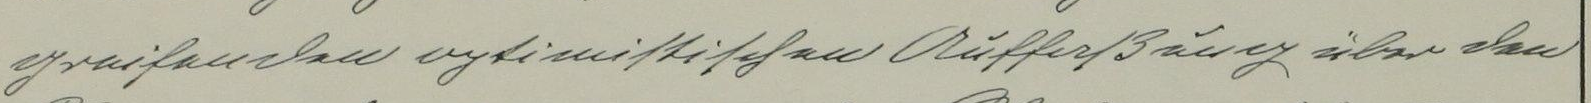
greifenden optimistischen Auffaßung über den
